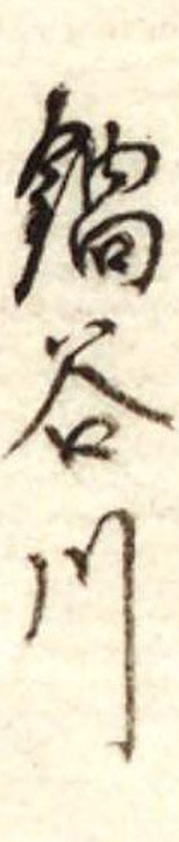鍋谷川
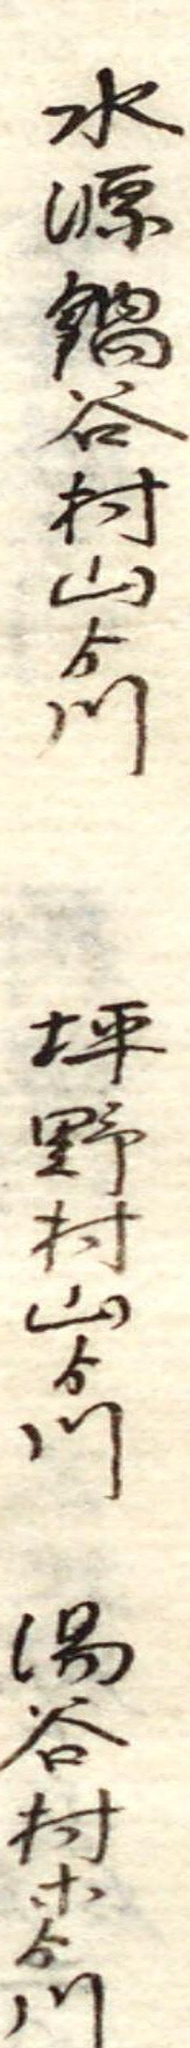水源鍋谷山ゟ川坪野村山ゟ川湯谷村等ゟ川
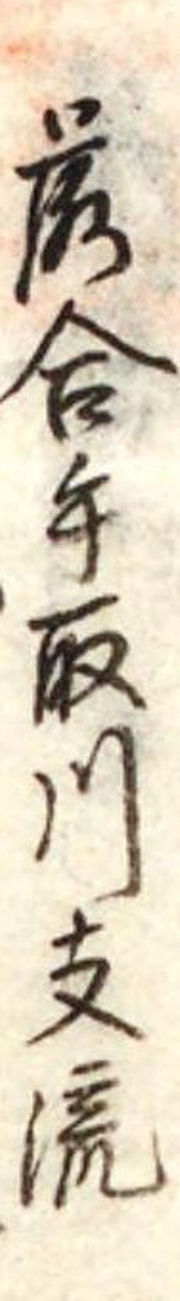落合手取川支流
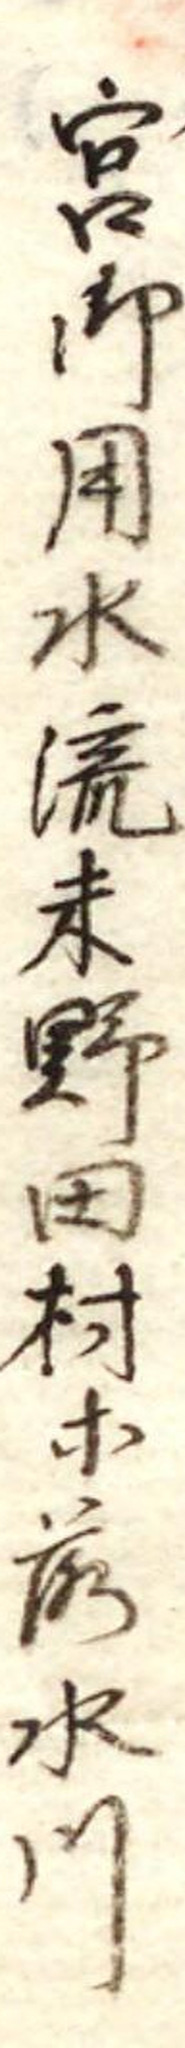宮御用水流未野田村等落水川
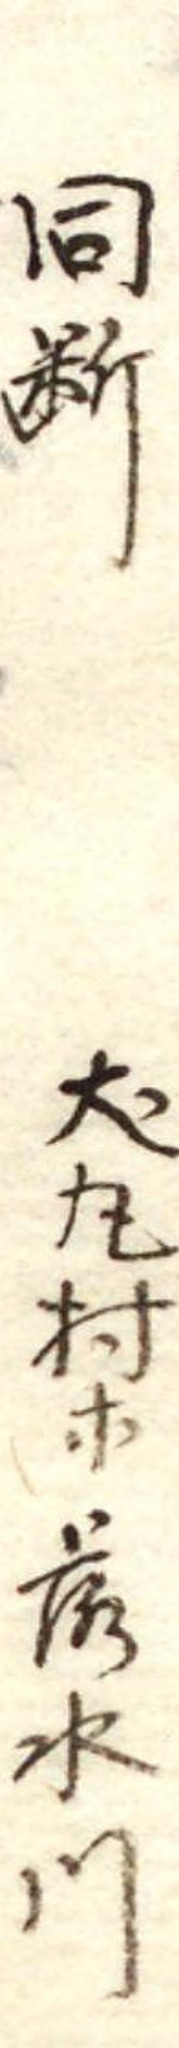同断犬丸村等落水川
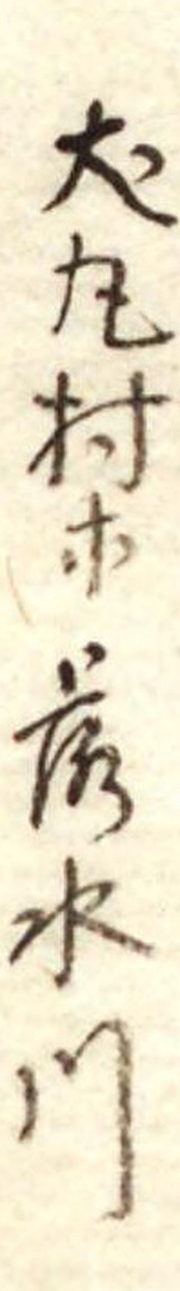同断犬丸村等落水川
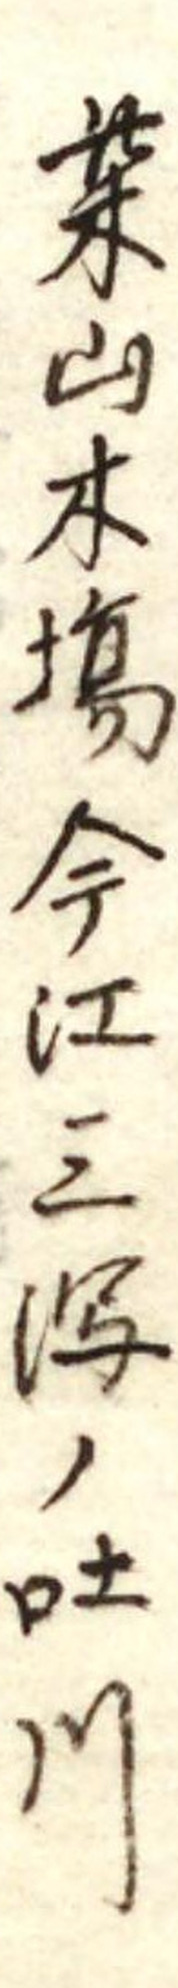柴山木場今江三泻ノ吐川
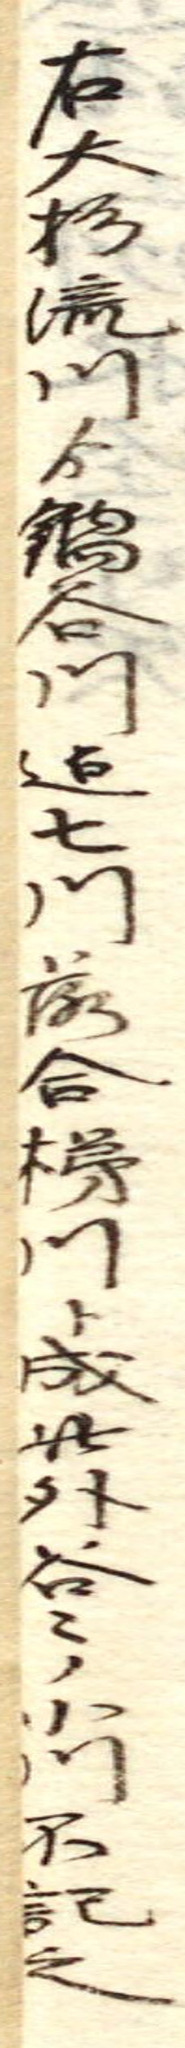右大杉流川ゟ鍋谷川追七川落合梯川ト成。此外谷々ノ小川不記之。
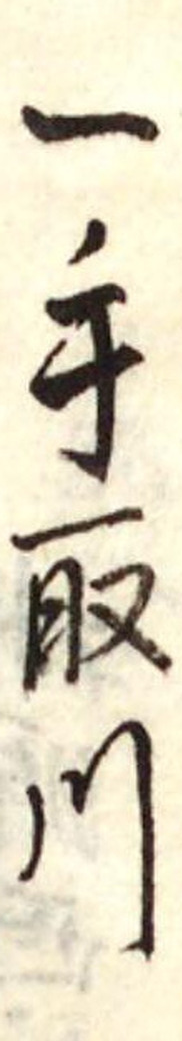一手取川
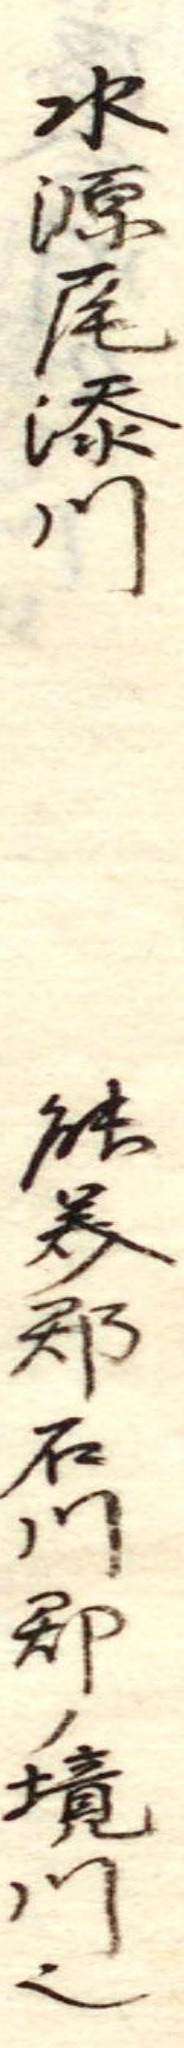水源尾添川能美郡石川郡ノ境川也
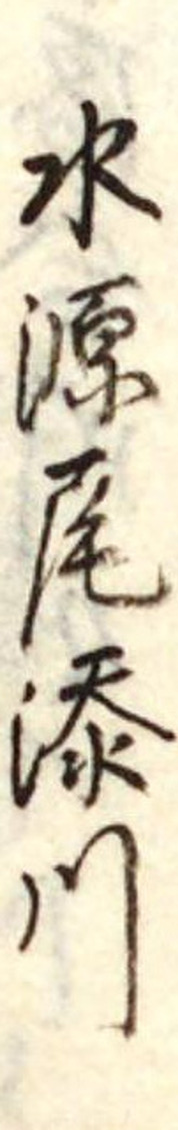水源牛首川
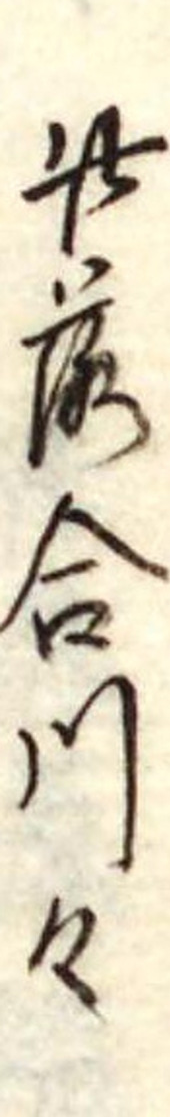此落合川々
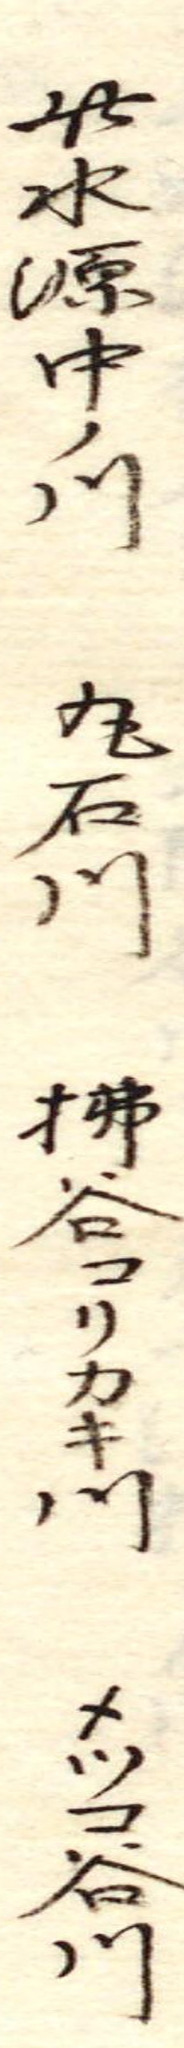此水源ノ中川丸石川払谷コリカキ川メツコ谷川
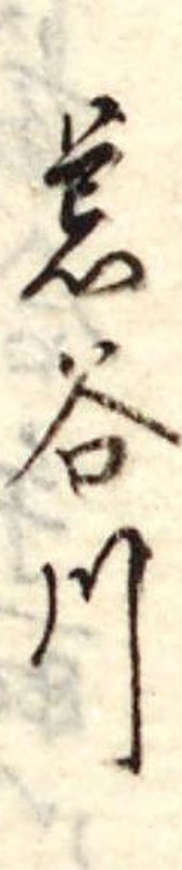郷谷川
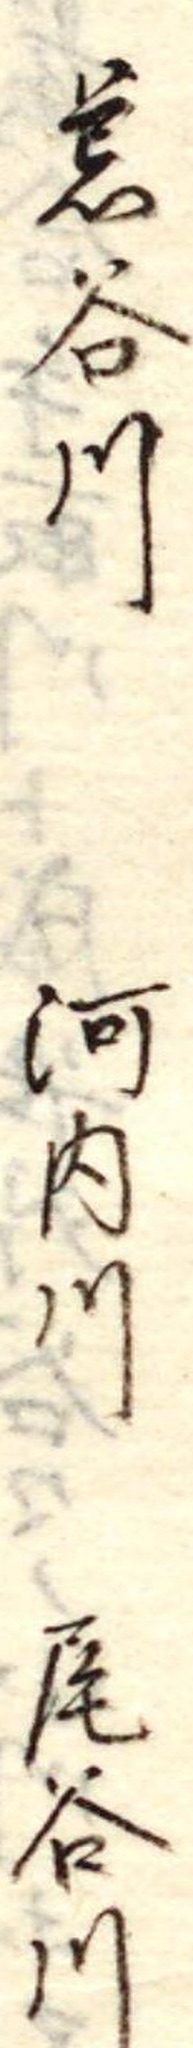荒谷川河内川尾谷川
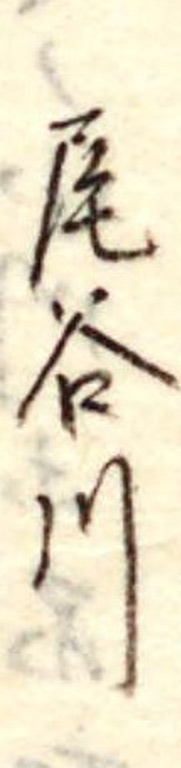郷谷川
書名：増補大路水経
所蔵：Ishikawa Prefectural Library
